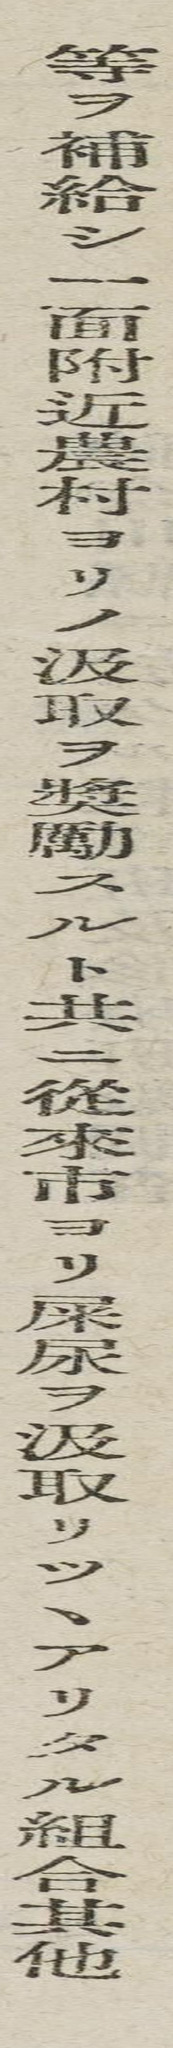等ヲ補給シ一面附近農村ヨリノ汲取ヲ奨励スルト共ニ従来市ヨリ屎尿ヲ汲取リツヽアリタル組合其他
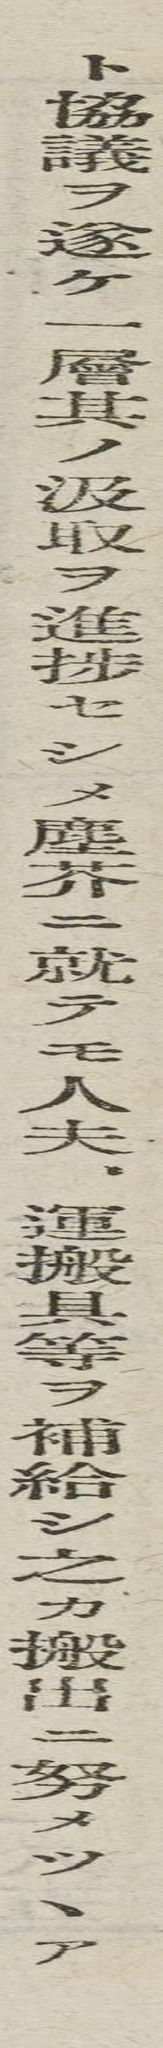ト協議ヲ遂ケ一層其ノ汲取ヲ進捗セシメ塵芥ニ就テモ人夫、運搬具等ヲ補給シ之カ搬出ニ努メツヽア
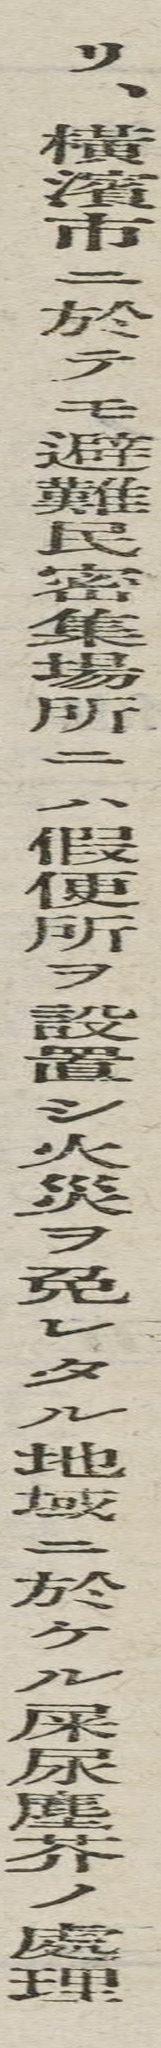リ、横浜市ニ於テモ避難民密集場所ニハ仮便所ヲ設置シ火災ヲ免レタル地域ニ於ケル屎尿塵芥ノ処理
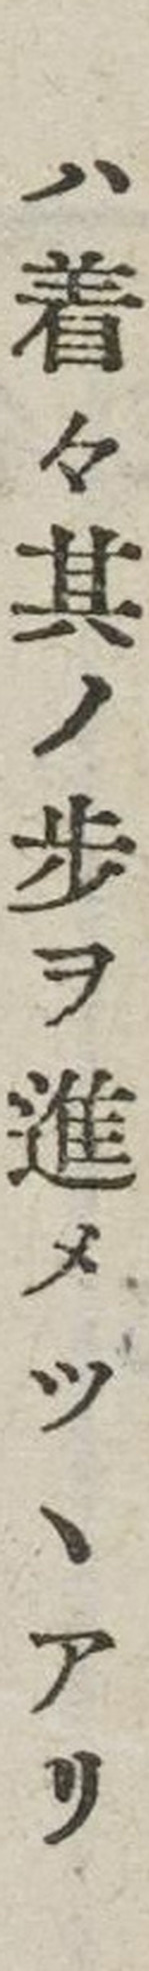ハ着々其ノ歩ヲ進メツヽアリ
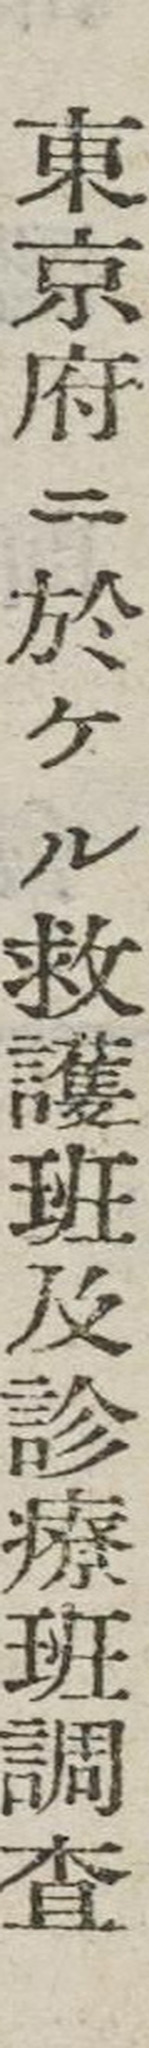東京府ニ於ケル救護班及診療班調査
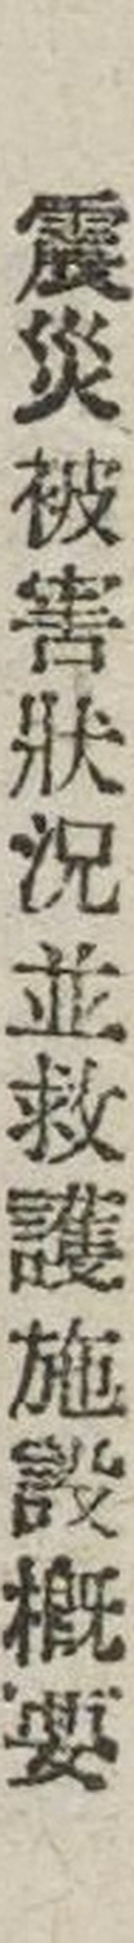震災被害状況並救護施設概要

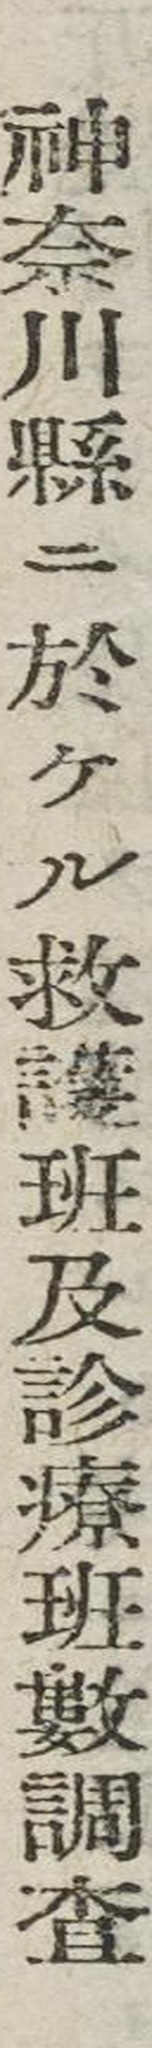神奈川県ニ於ケル救護班及診療班数調査

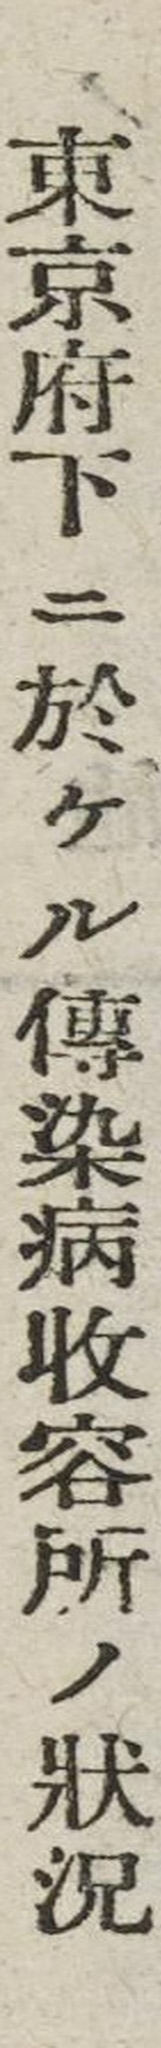東京府下ニ於ケル伝染病収容所ﾉ情況
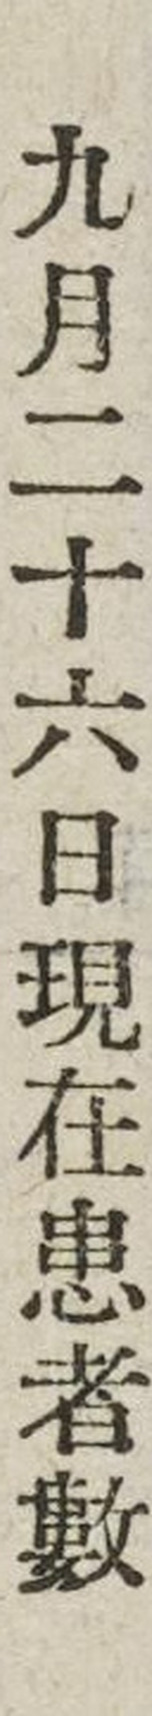九月二十六日現在患者数
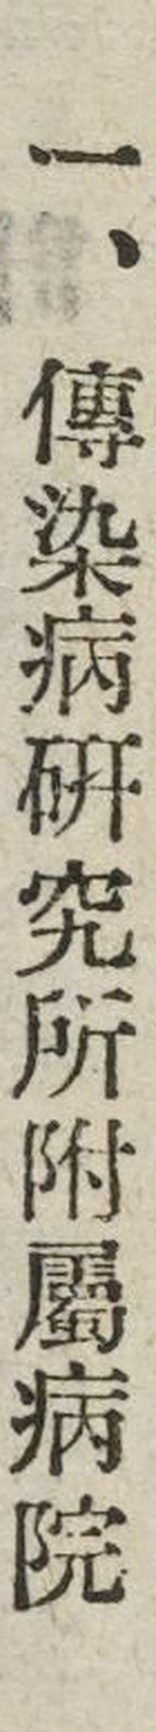一、伝染病研究所付属病院三二
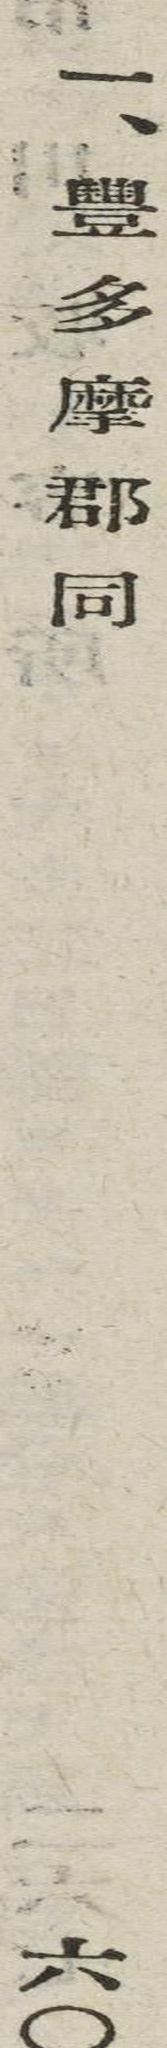一、豊多摩郡同六〇
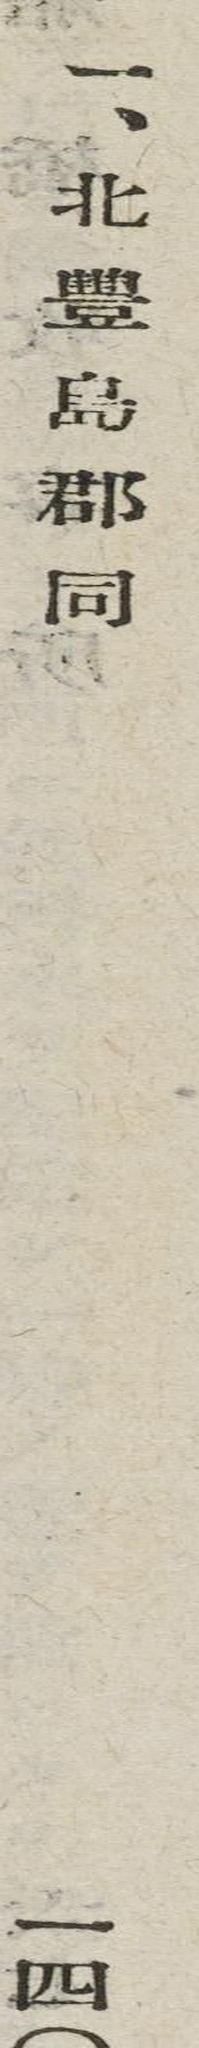一、北豊島郡同一四〇
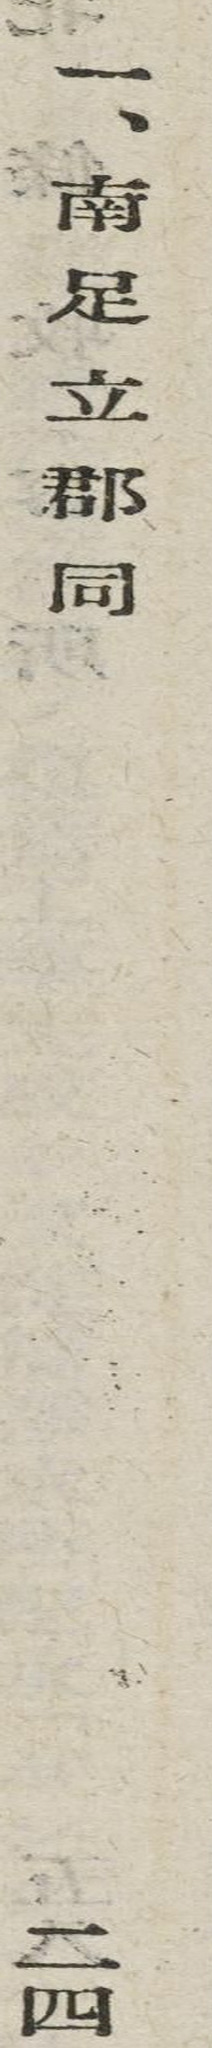一、南足立郡同二四
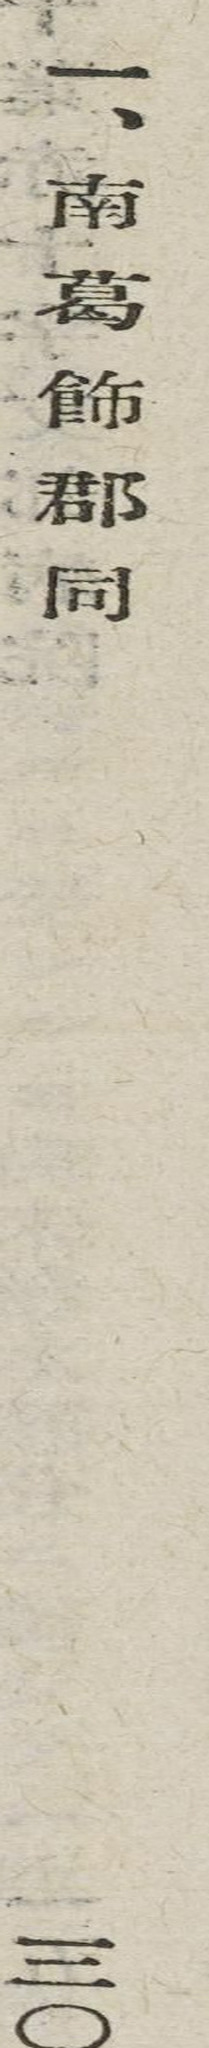一、南葛飾郡同三〇
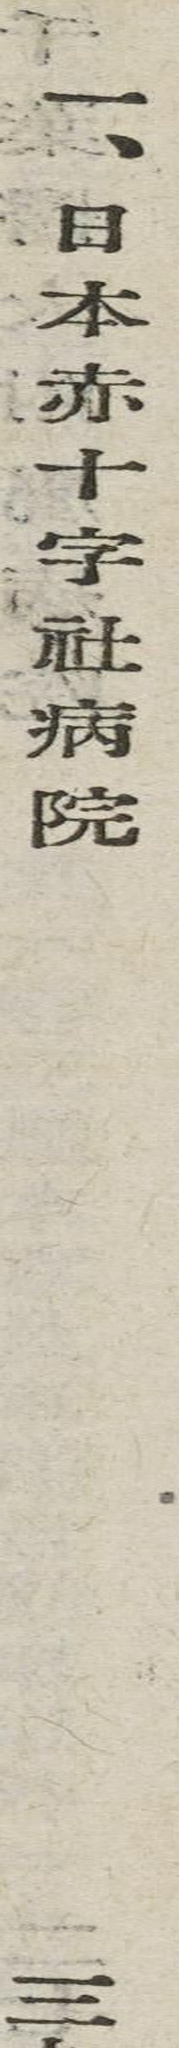一、日本赤十字社病院三九

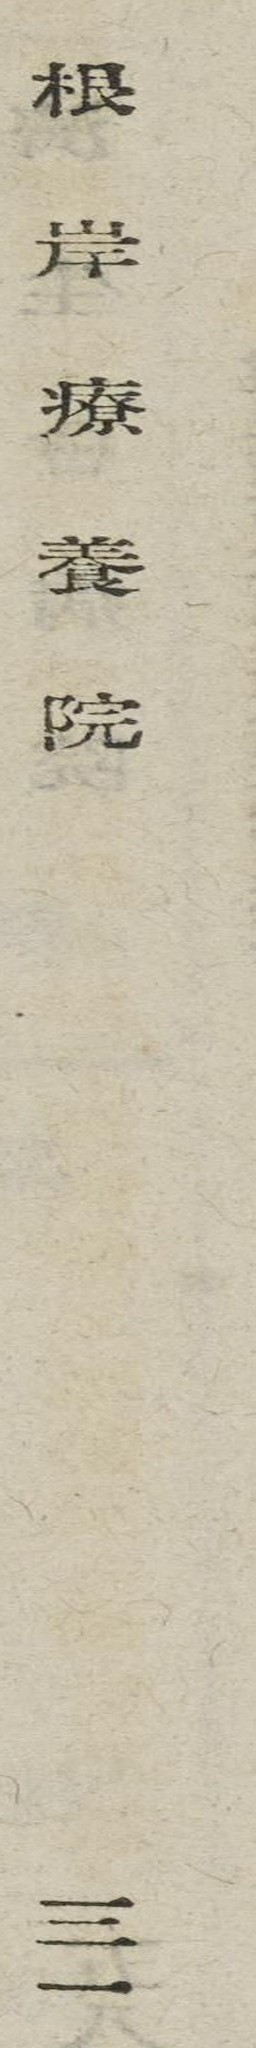根岸療養院三一
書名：震災被害状況並救護施設概要
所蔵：東京大学地震研究所図書室 Earthquake Research Institute Library, The University of Tokyo, JAPAN
